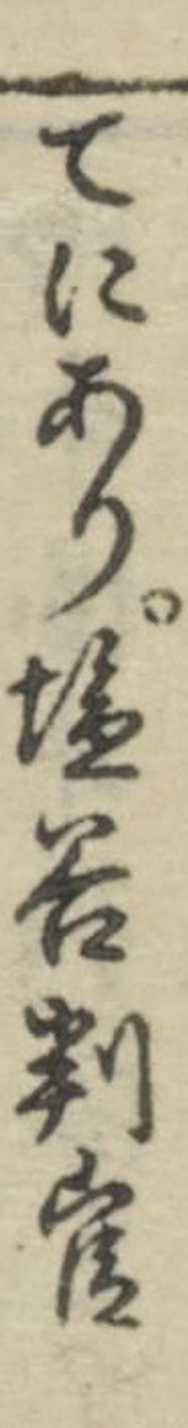てにあり。塩谷判官
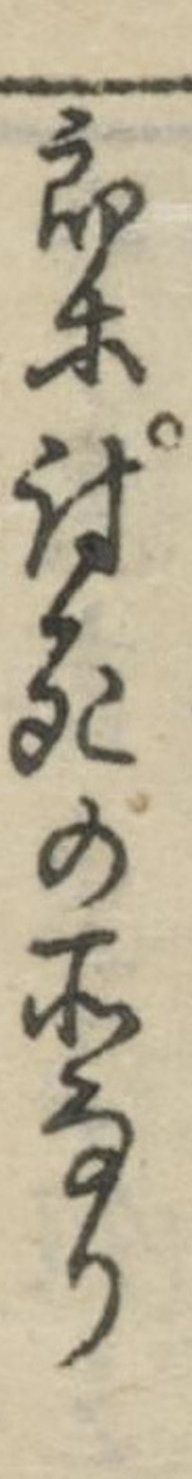郎等。討死の所なり
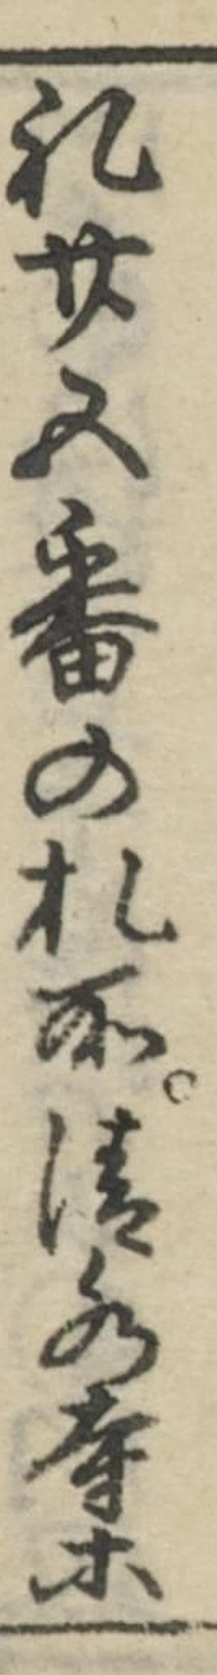礼廿五番の札所。清水寺等
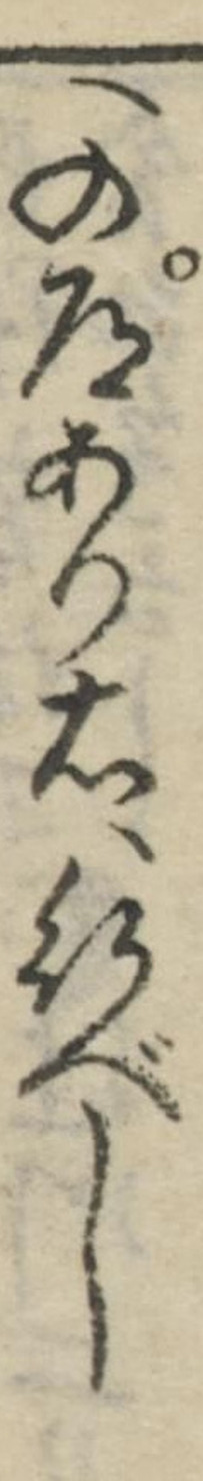への。道あり右へ行べし
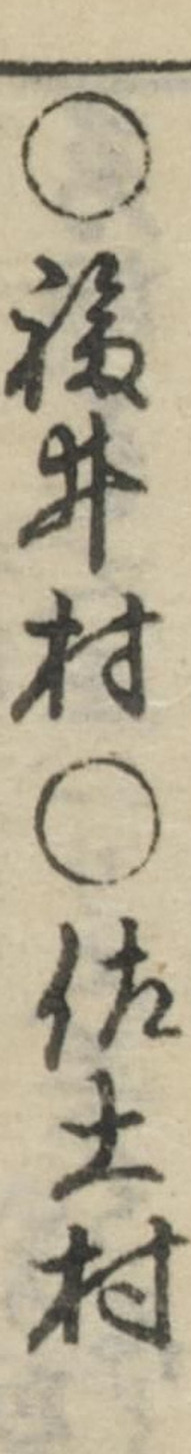○福井村○佐土村
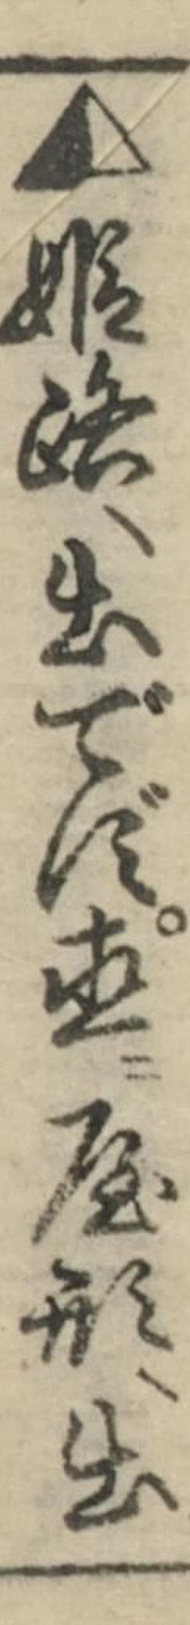▲姫路へ出でず。直に屋形へ出

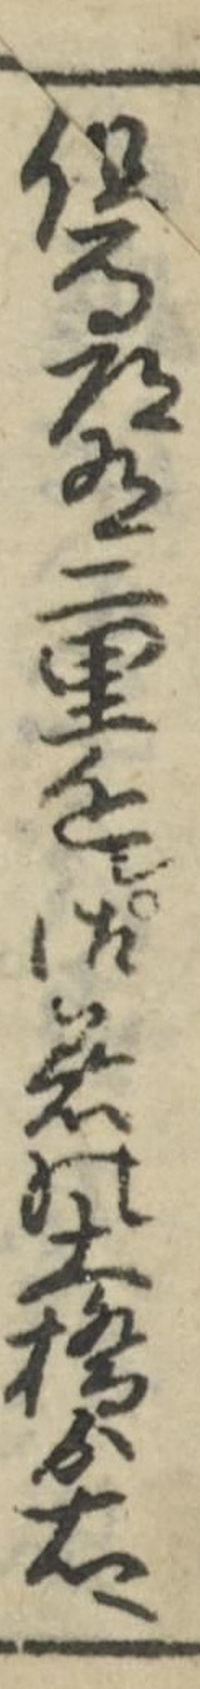但馬道有ニ里近し。御着の土橋ゟ右へ
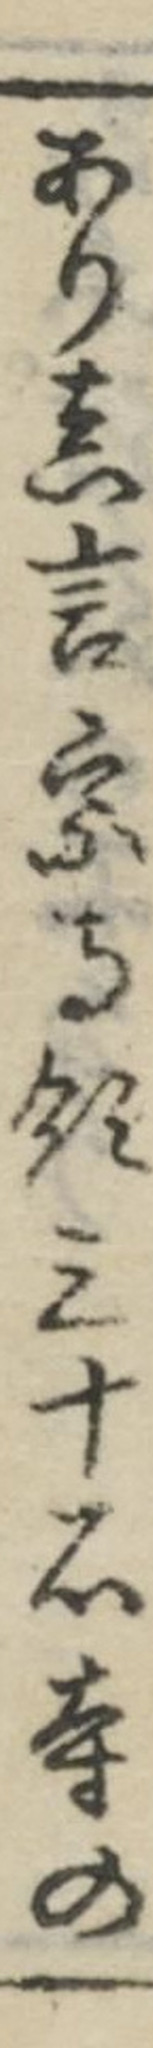あり真言宗寺領三十石寺の
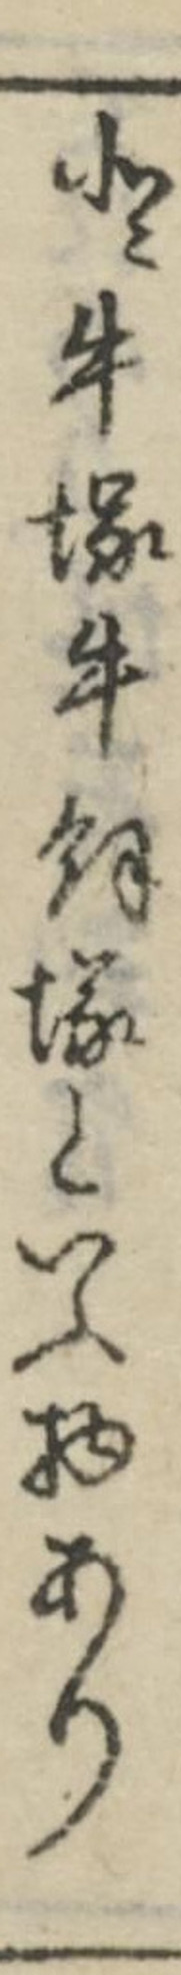北に牛塚牛飼塚といふ物あり
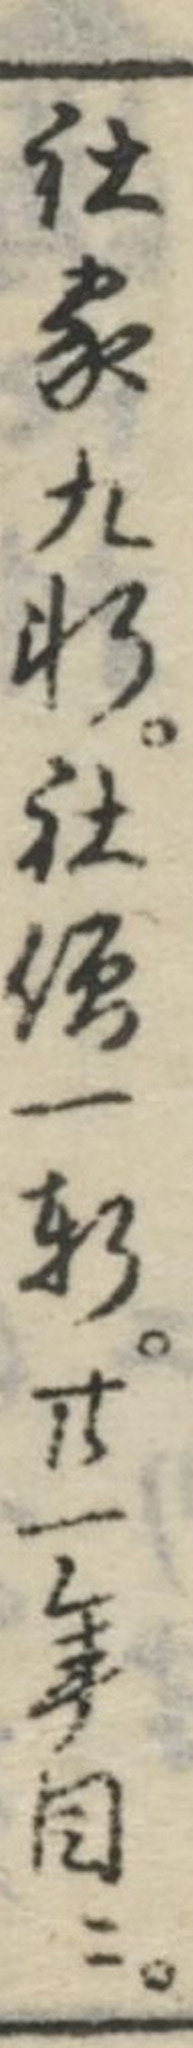社家九軒。社僧一軒。廿一年目に。
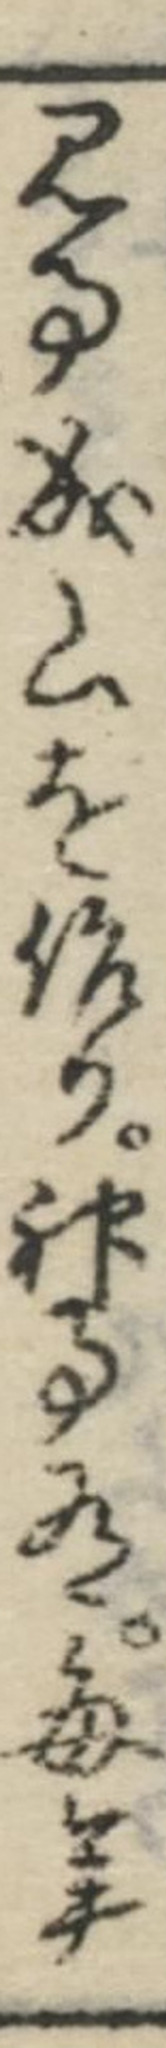見事成山を作り。神事有。毎年
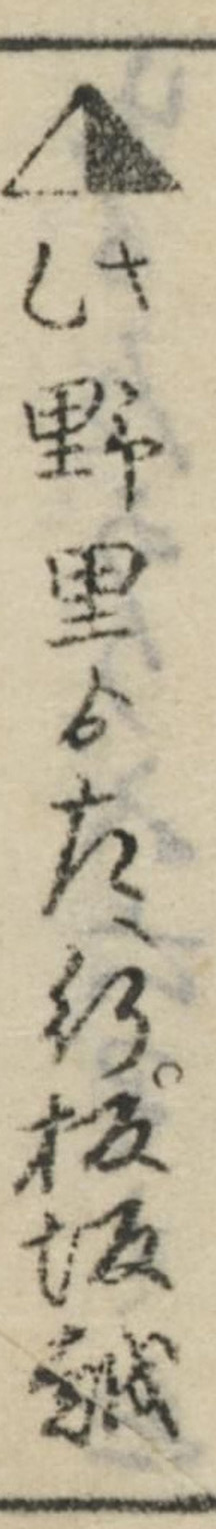▲此野里ゟ左へ行。板坂越

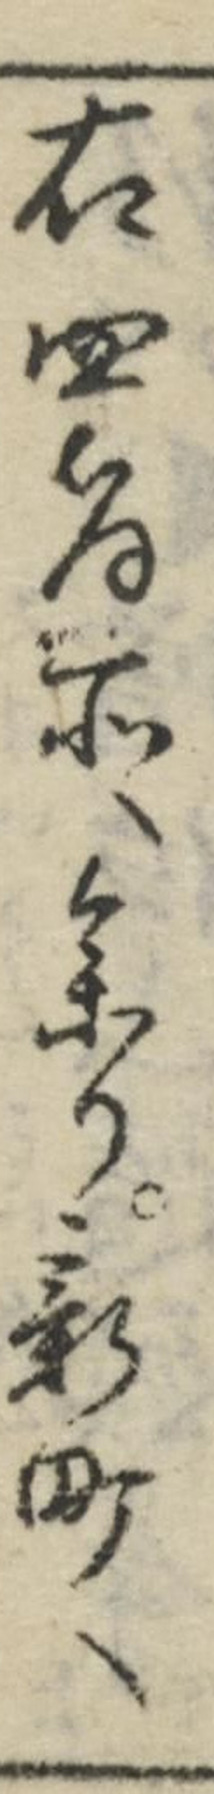右四箇所へ参り。新町へ
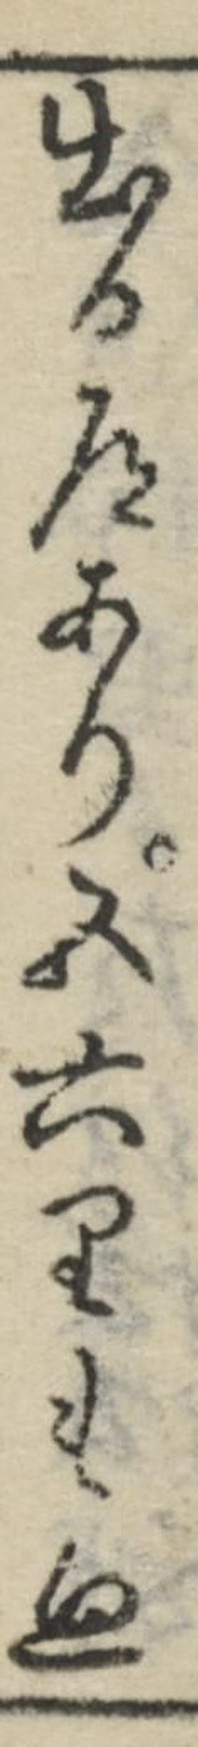出る道あり。五六里も廻
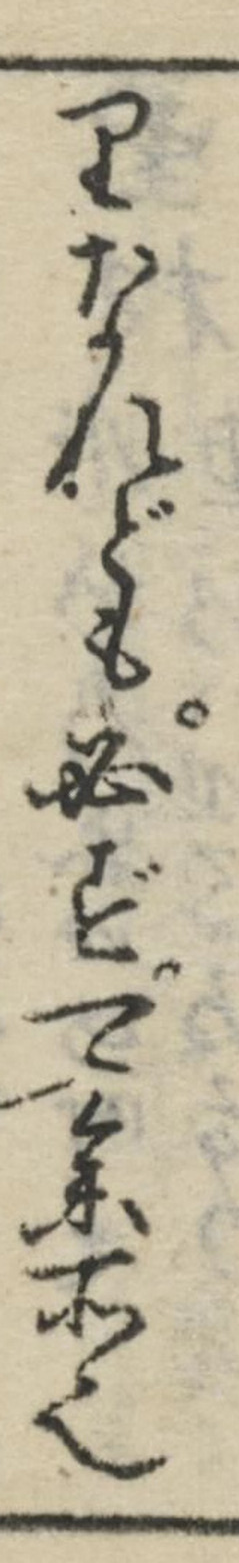りなれども。必ず。可参所也
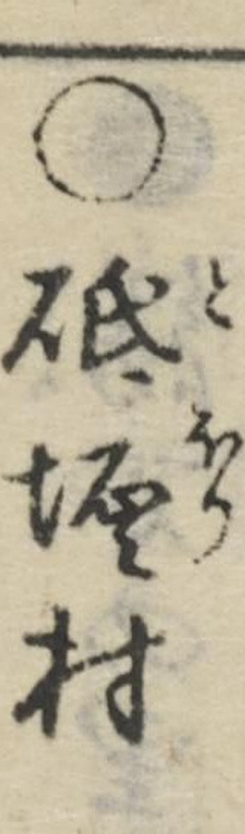○砥堀村
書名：但州城崎浴湯辧
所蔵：東京大学地震研究所図書室 Earthquake Research Institute Library, The University of Tokyo, JAPAN
